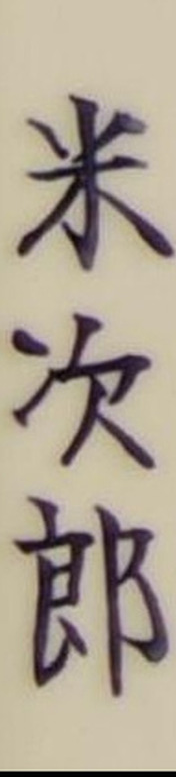米次郎

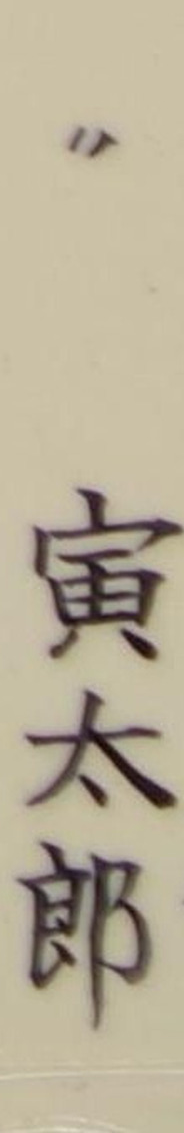寅太郎
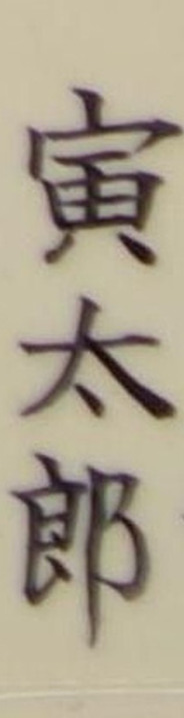寅太郎
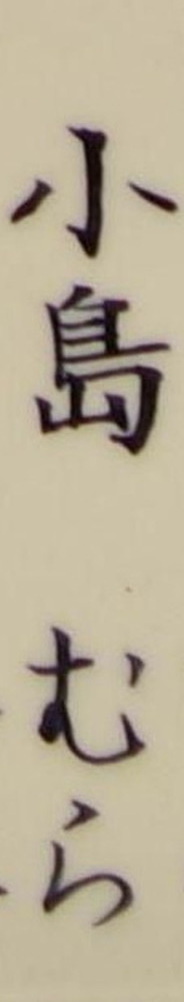小島むら
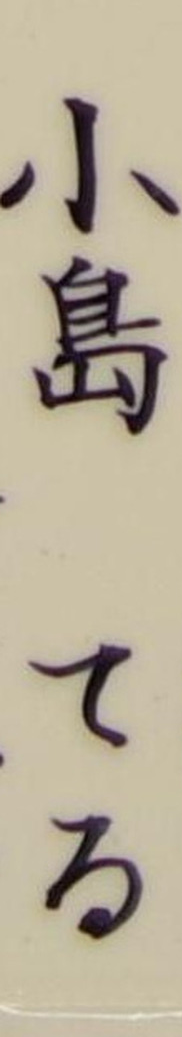小島てる
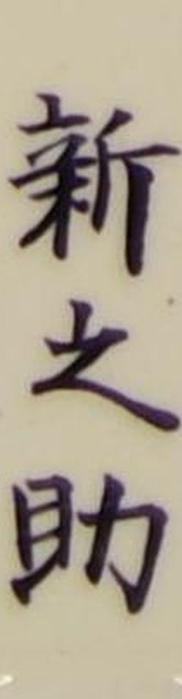新之助

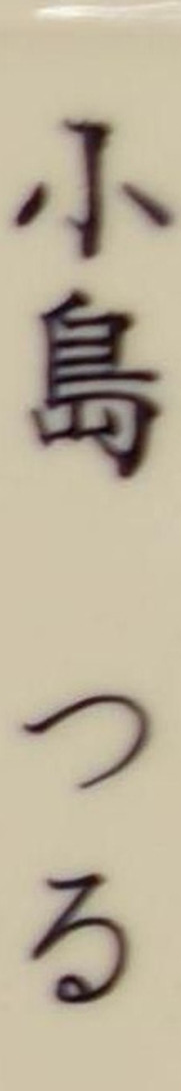小島つる
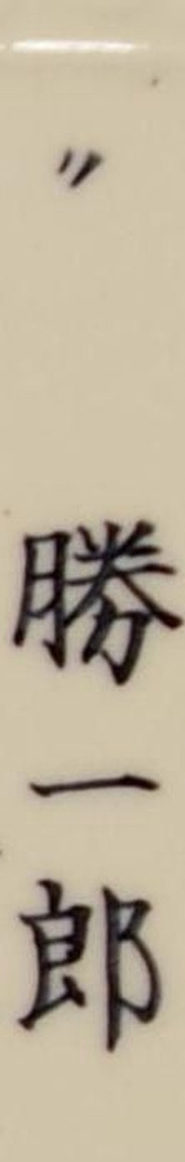勝一郎
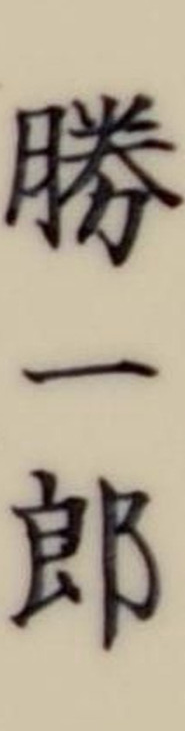勝一郎
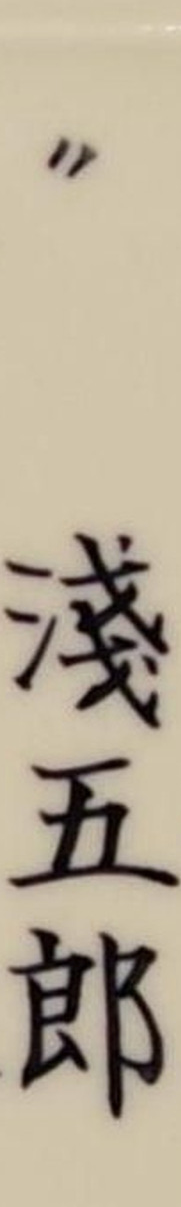浅五郎
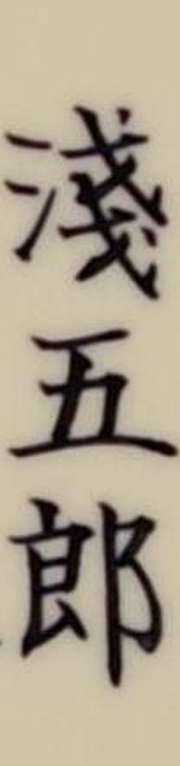浅五郎
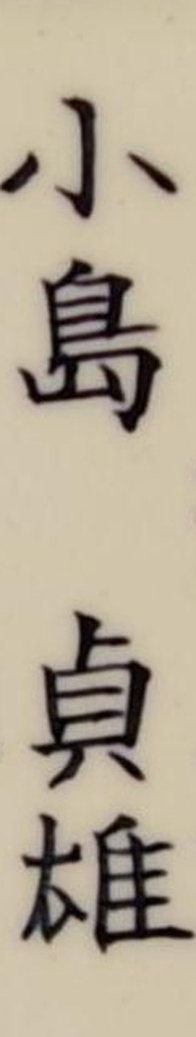小島貞雄
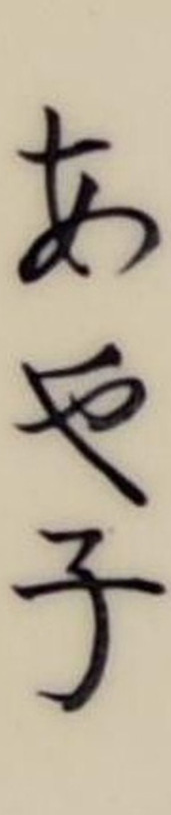あや子
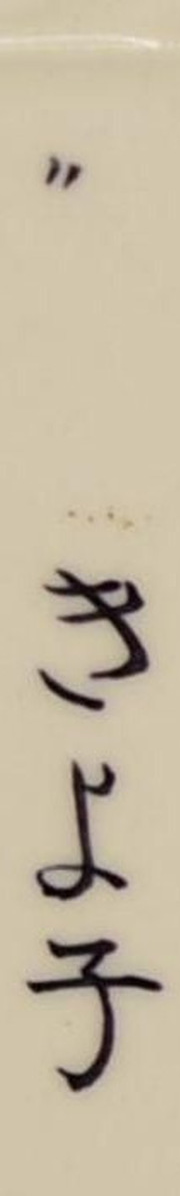きよ子
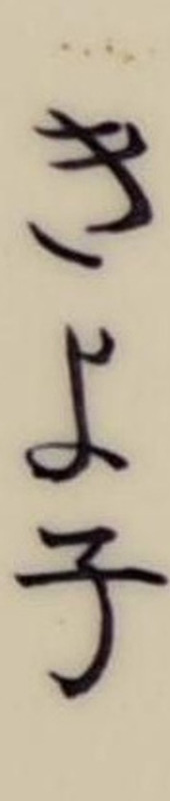きよ子
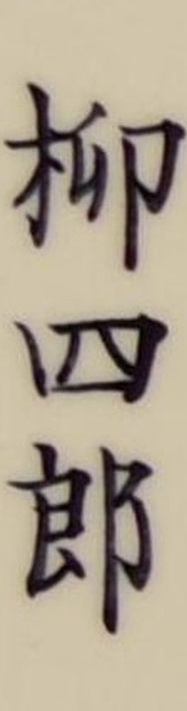柳四郎
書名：E~L
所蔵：高野山金剛峯寺
